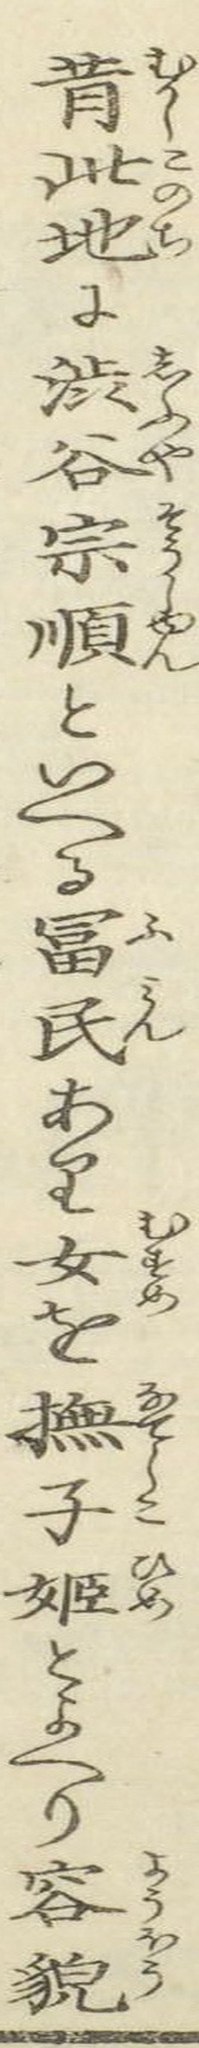昔此地に渋谷宗順といへる冨民あり女を撫子姫とよへり容貌
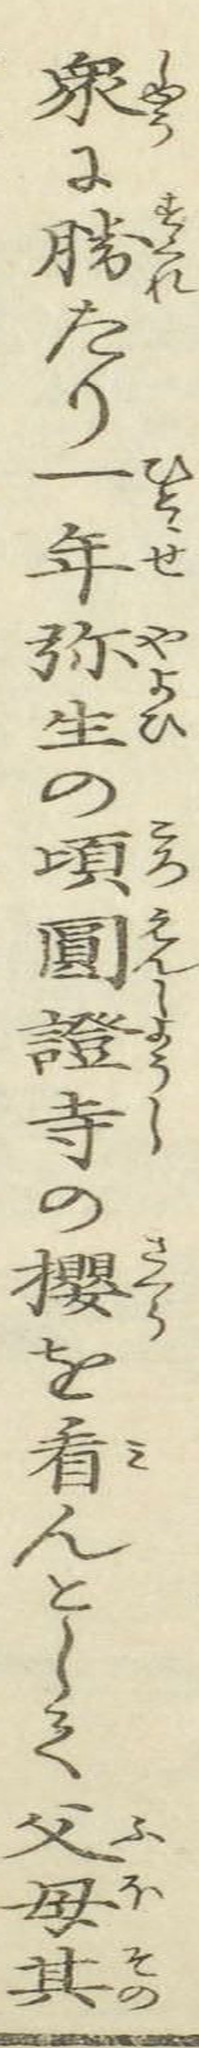衆に勝たり一年弥生の頃圓證寺の櫻を看んとして父母其
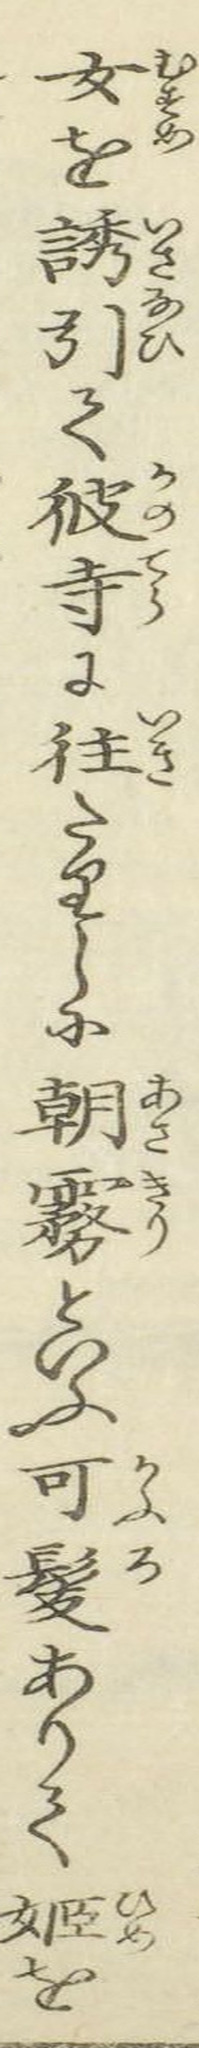女を誘引て彼寺に往たりしに朝霧といふ可髪ありて姫を
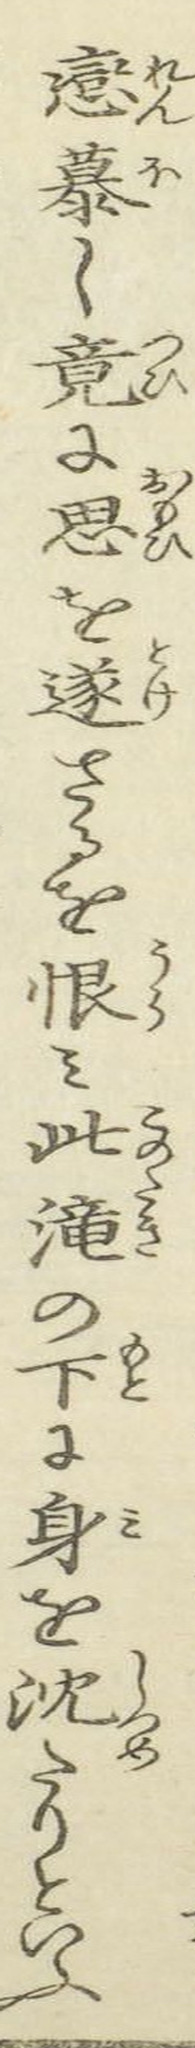戀慕し竟に思を遂さるを恨み此滝の下に身を沈たりといふ
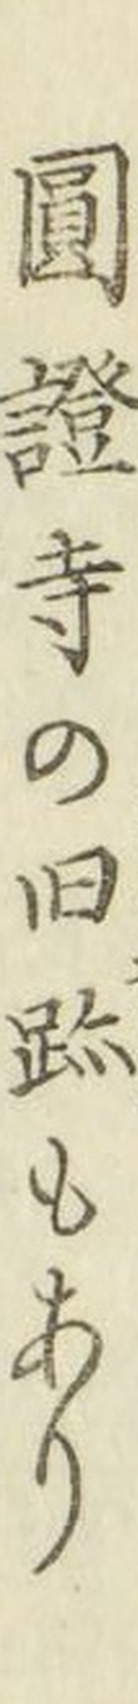圓證寺の旧跡もあり
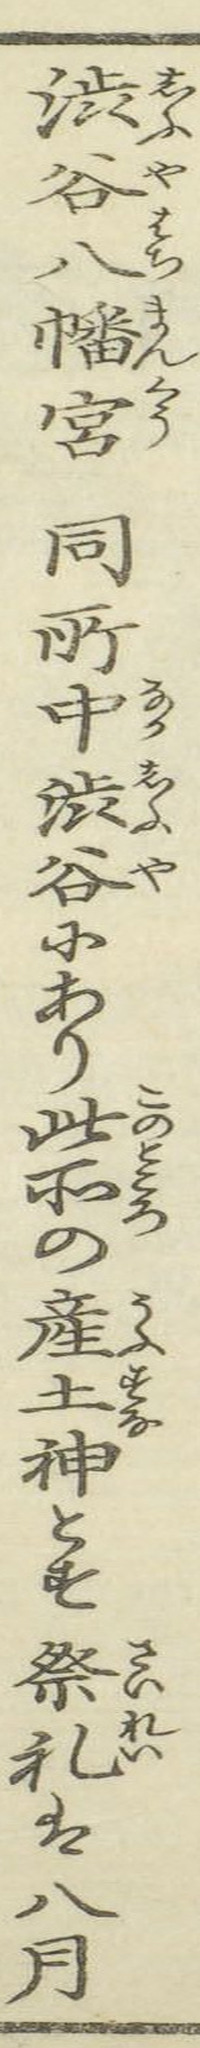渋谷八幡宮同所中渋谷にあり此所の産土神とす祭礼は八月
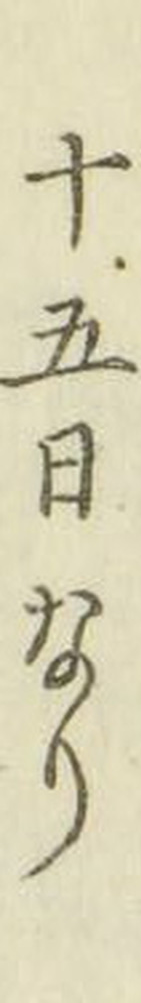十五日なり
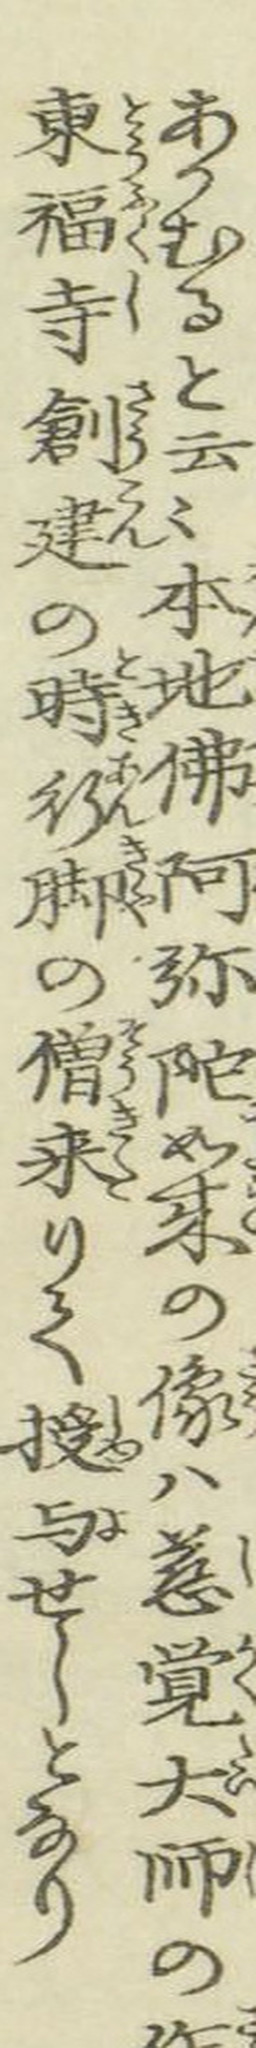東福寺創建の時行脚の僧来りて授与せしとなり

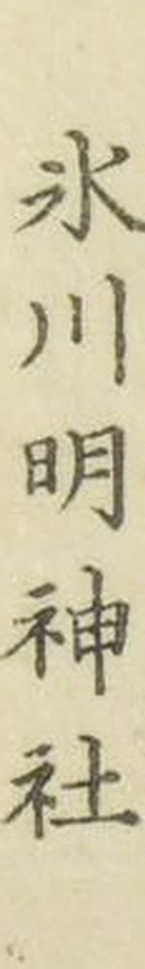氷川明神社

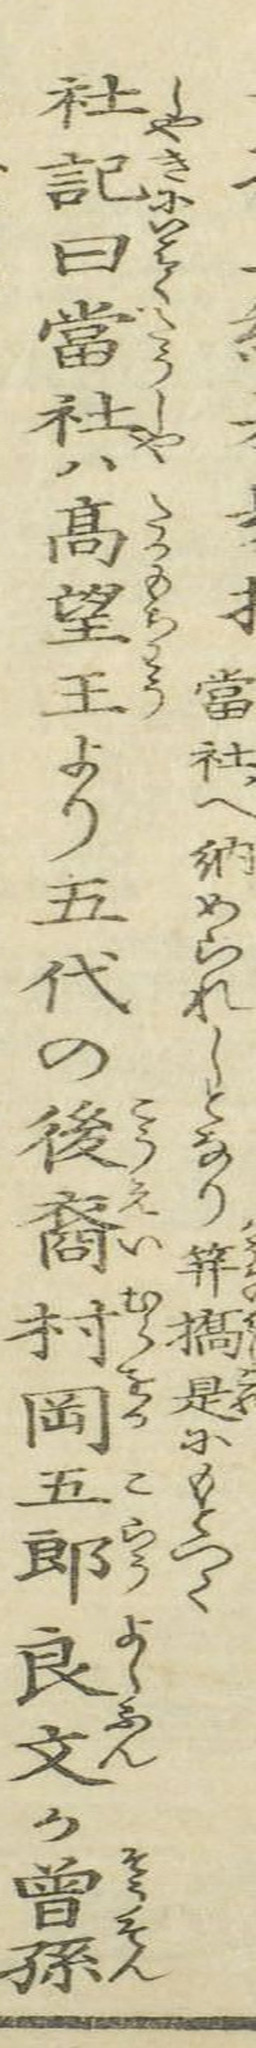社記曰當社は髙望王より五代の後裔村岡五郎良文か曾孫
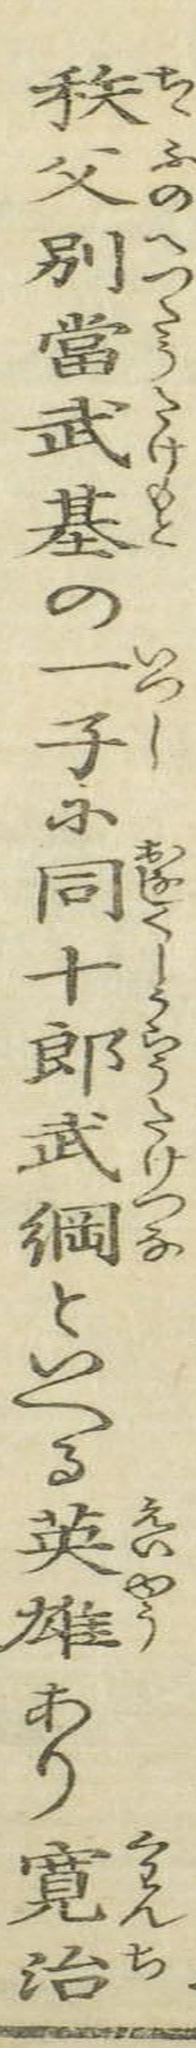秩父別當武基の一子に同十郎武綱といへる英雄あり寛治
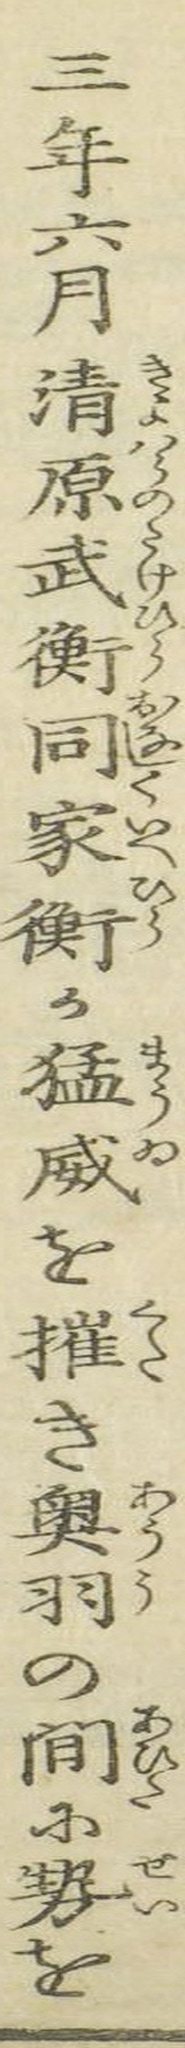三年六月清原武衡同家衡か猛威を摧き奥羽の間に勢を
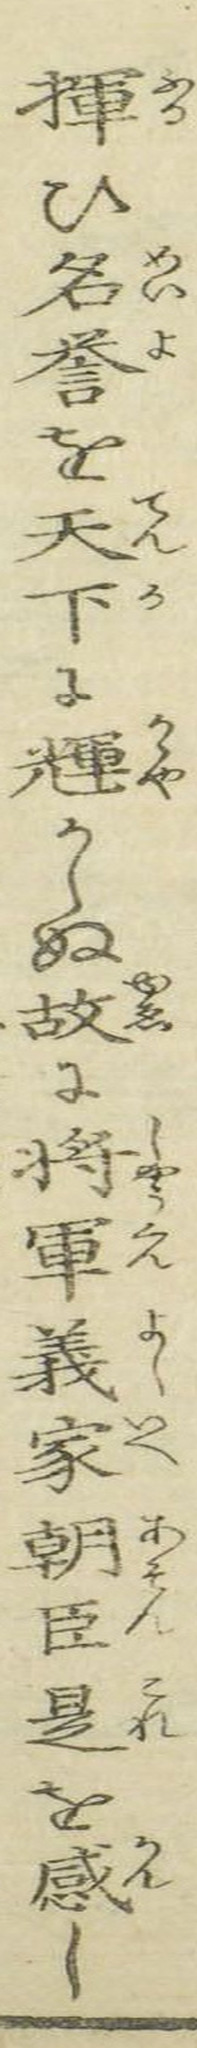揮ひ名誉を天下に輝かしぬ故に将軍義家朝臣是を感し

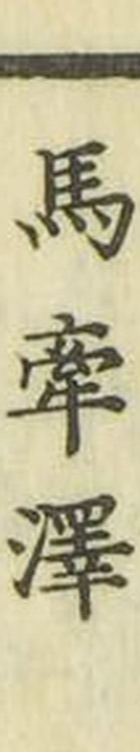馬牽澤

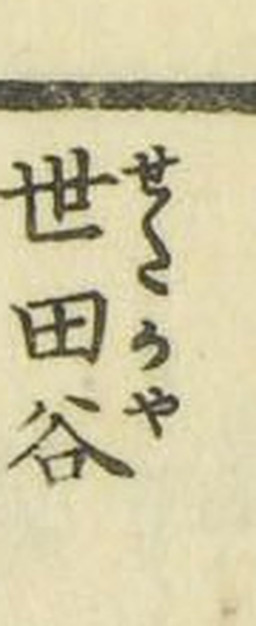世田谷

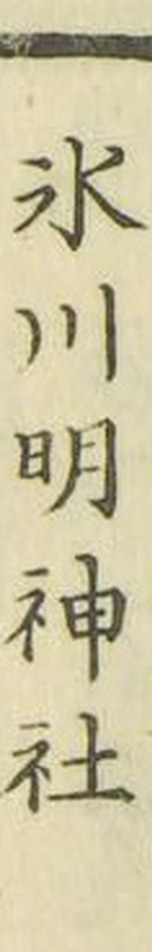氷川明神社
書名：江戸名所図会 20巻 巻之8
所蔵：東京学芸大学教育コンテンツアーカイブ
